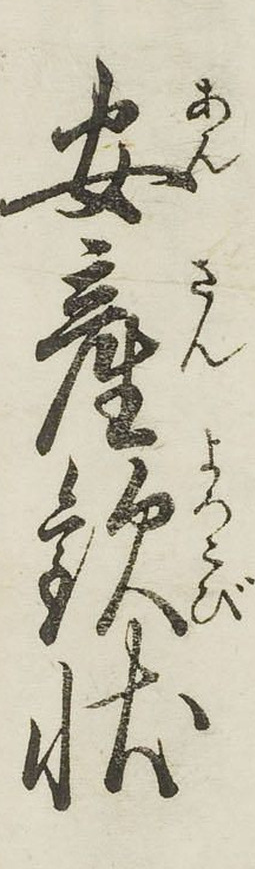安産歓状
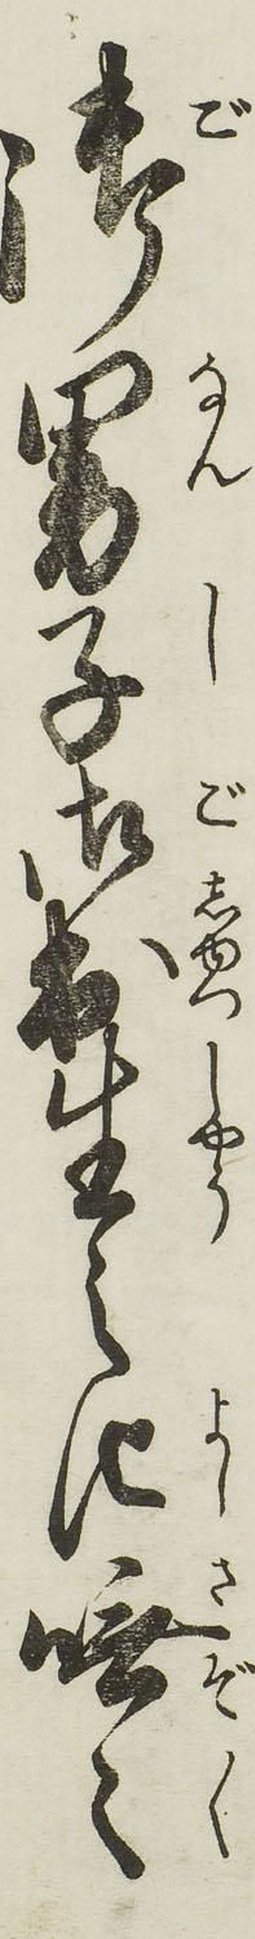御男子御出生之由嘸々
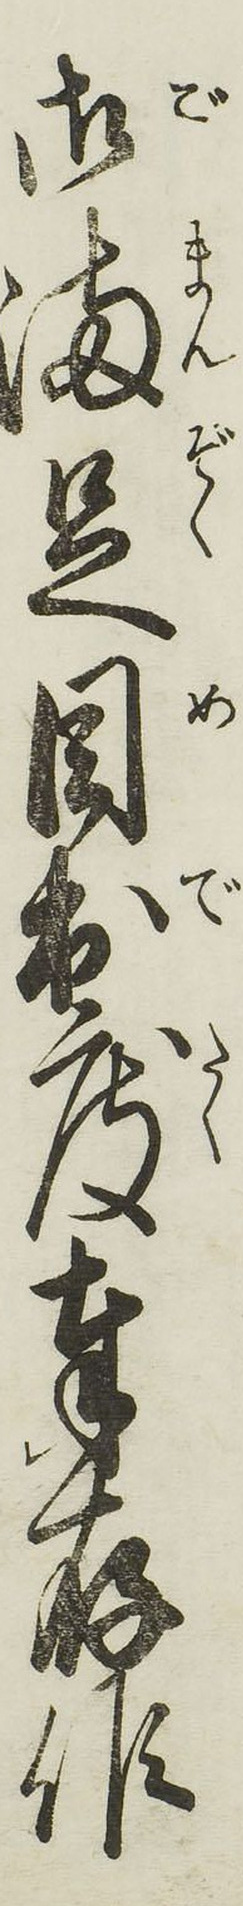御満足目出度奉存候
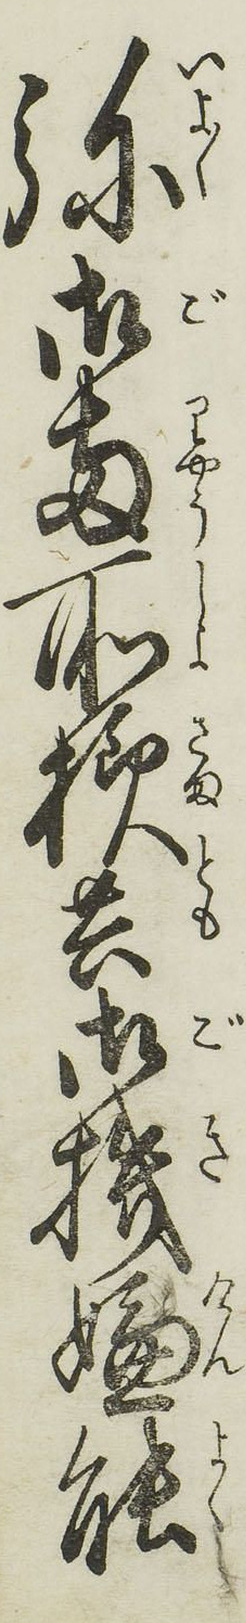弥御両所様共御機嫌能

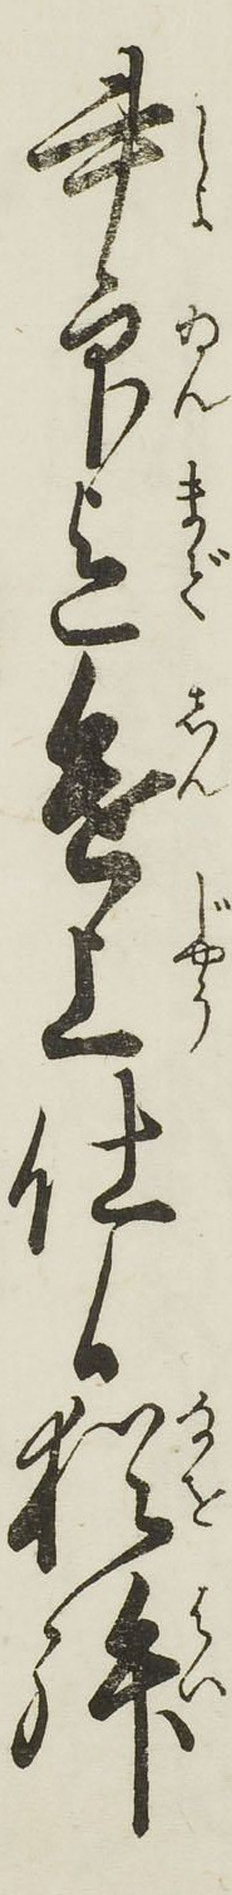書印迄進上仕候猶拝
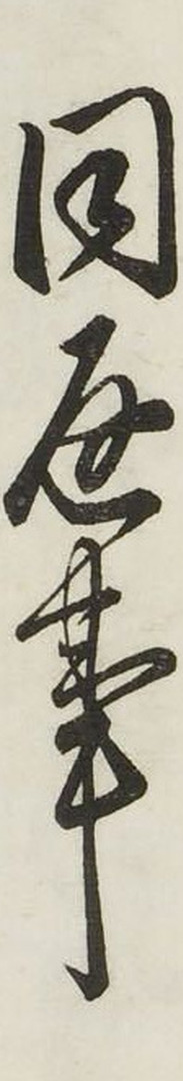同返事

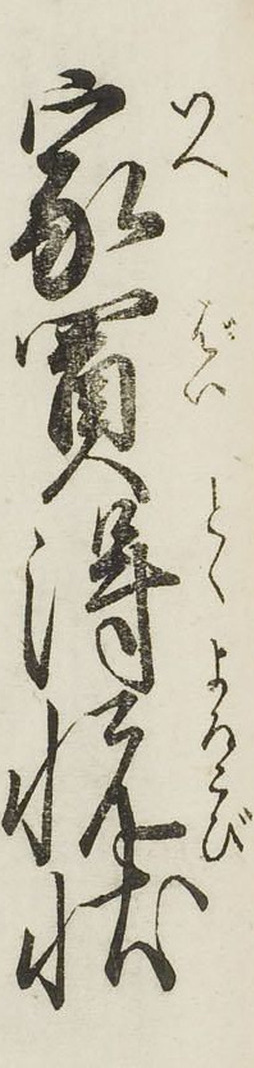家買得悦状

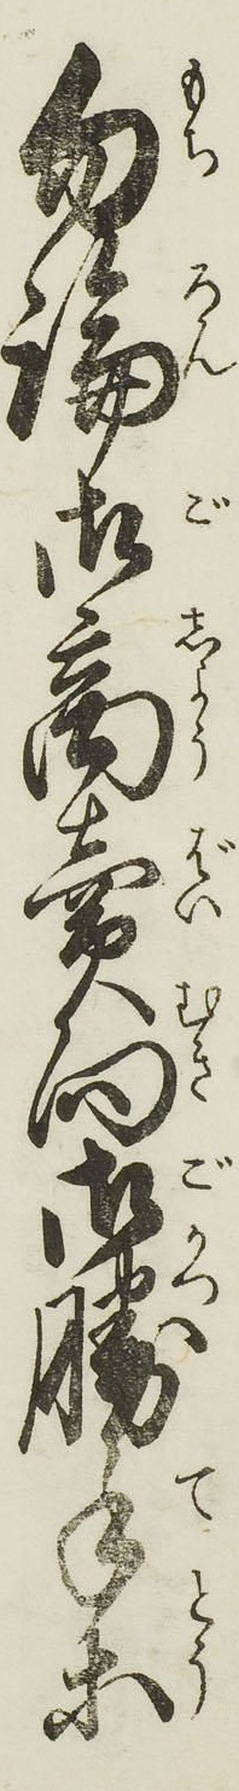勿論御商売向御勝手等

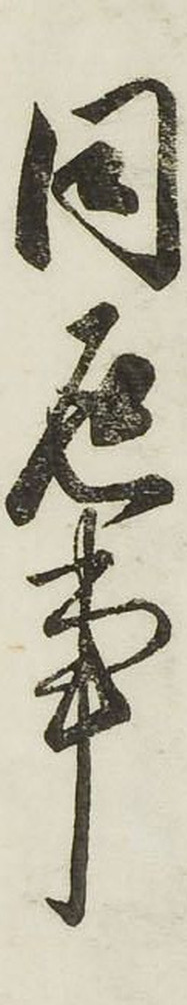同返事
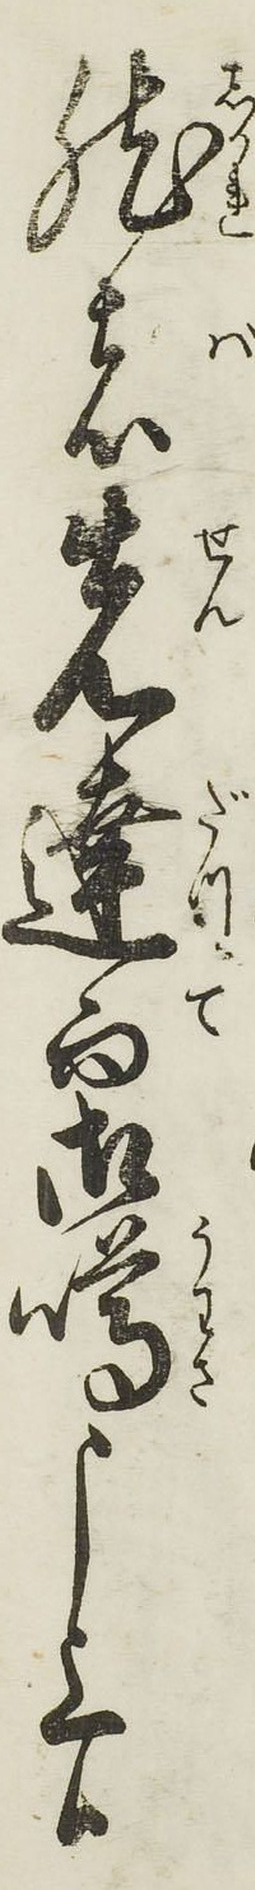然者先達而御噂申上候
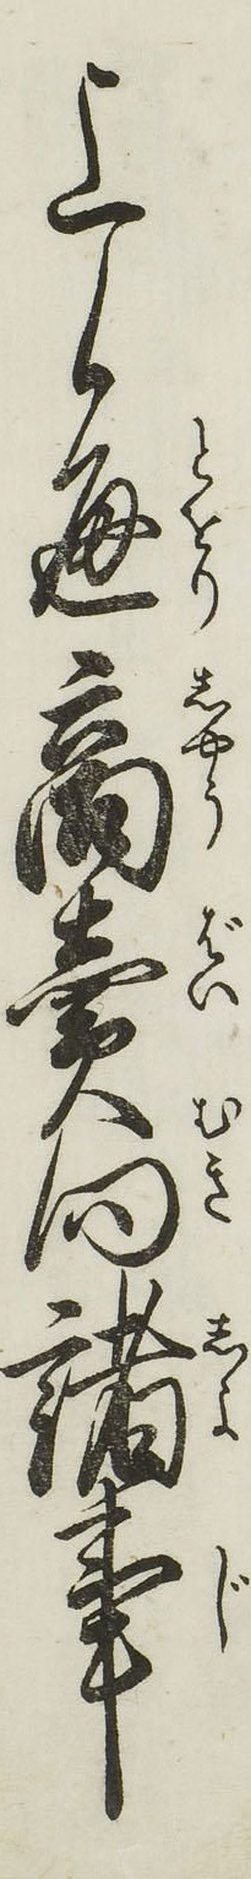上候通商売向諸事

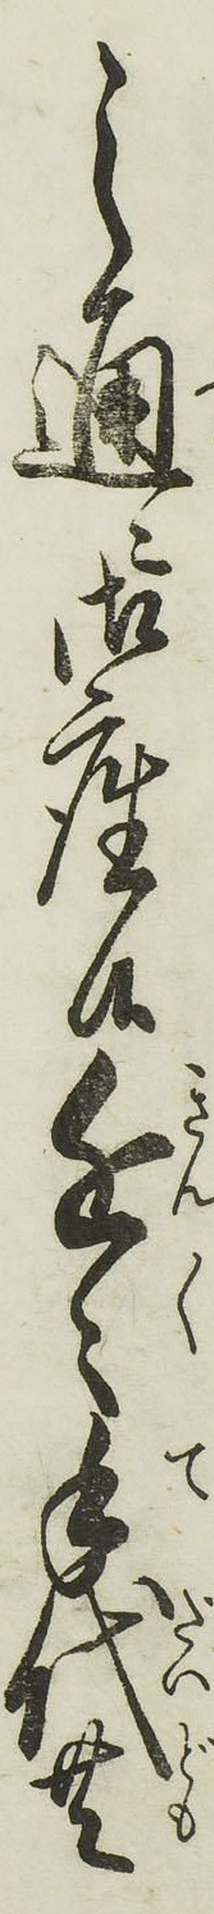之通御座候近々手代共
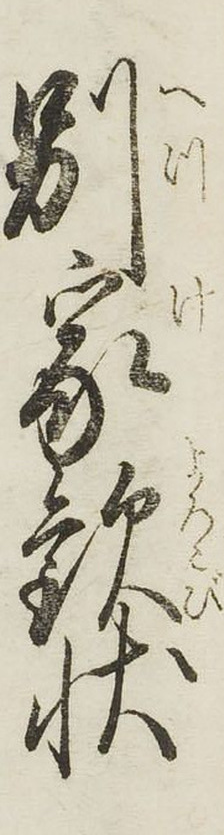別家歓状

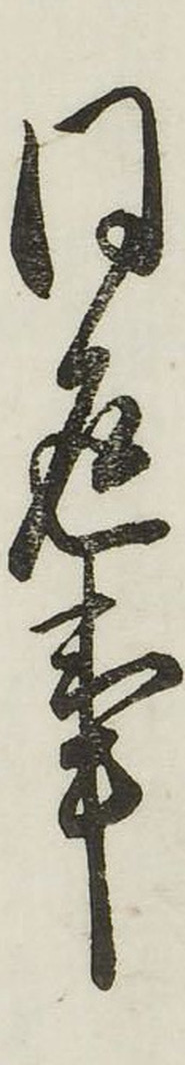同返事

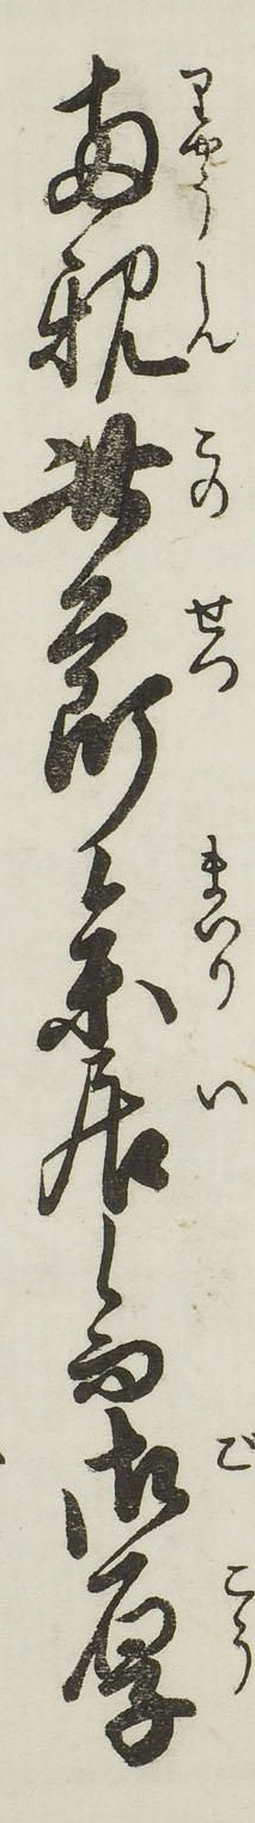両親此節参居候而御厚

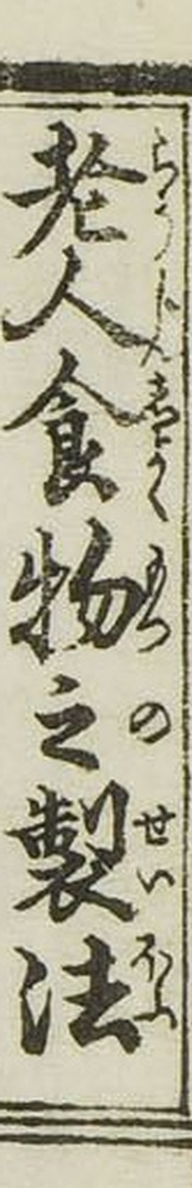老人食物之製法
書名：商人書翰便覧
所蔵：東京学芸大学教育コンテンツアーカイブ
